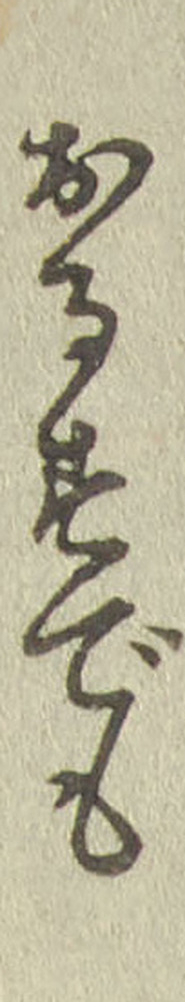おるすでも
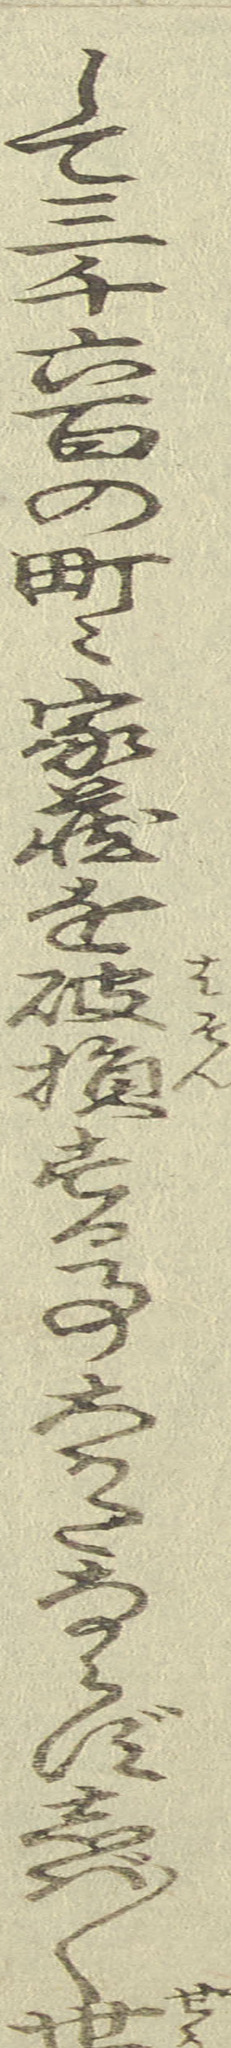して三千六百の町々家蔵を破損する事大かたならずしば〳〵世界
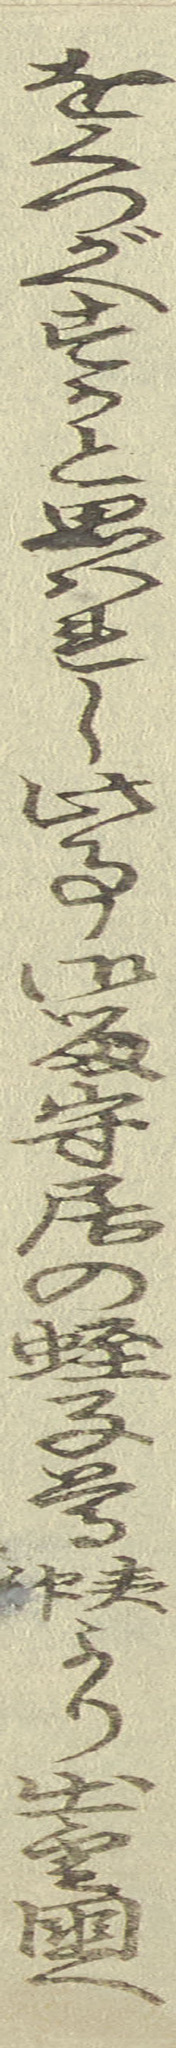をくつがへすかと思はれし此事御留守居の蛭子尊夷神より出雲國へ
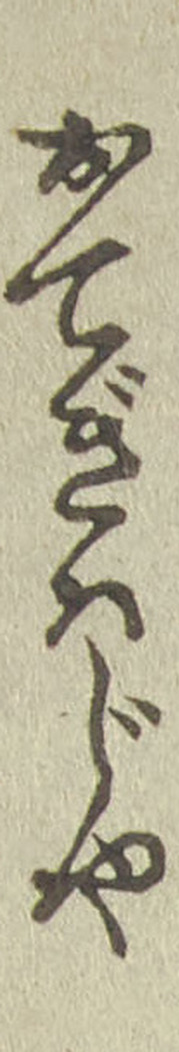おてぎはじや
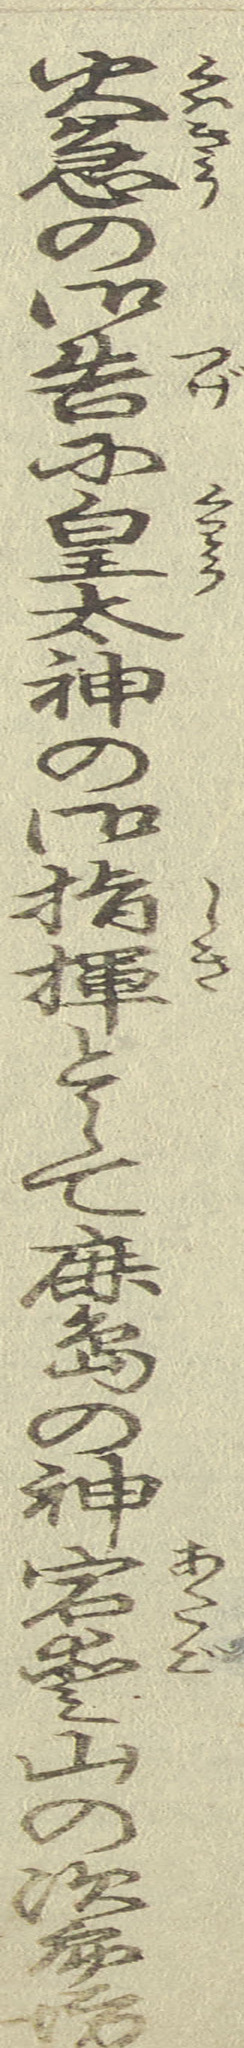火急の御告に皇太神の御指揮として鹿島の神宕愛山の次郎坊
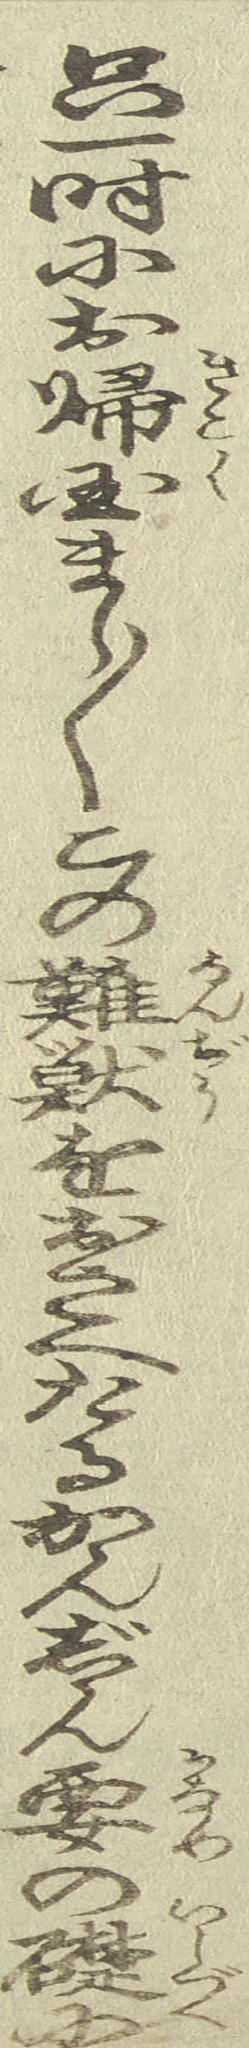只一時にお帰国まし〳〵この難獣をおさへたるかんじん要の礎に世は
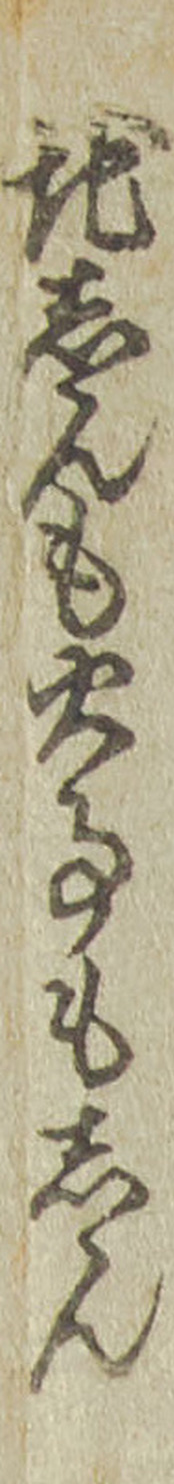地しんも火事もしん
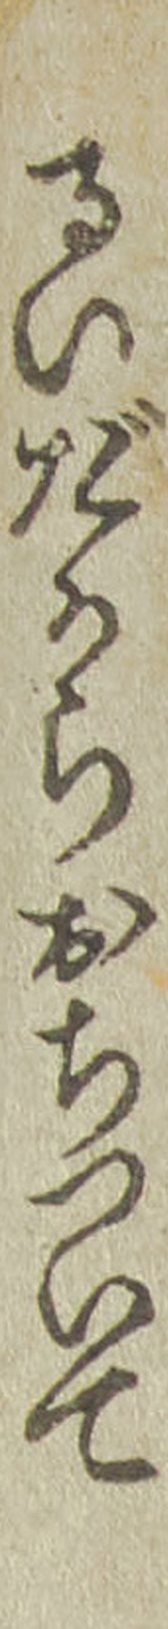るいだからおちついて
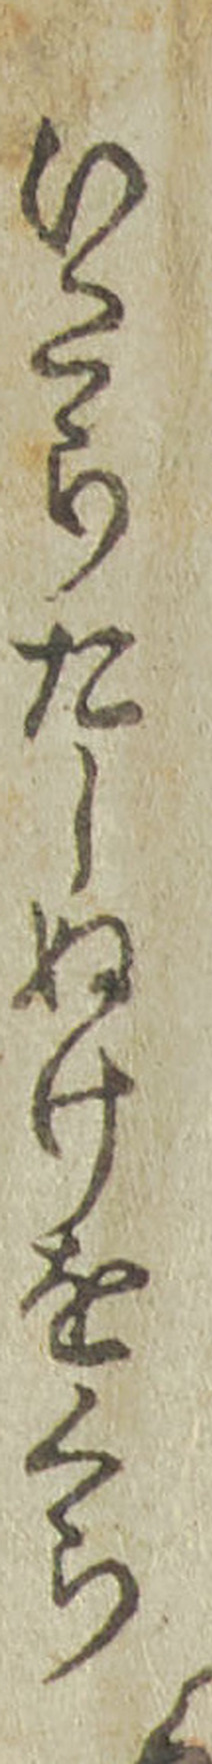いたらたしぬけをくら
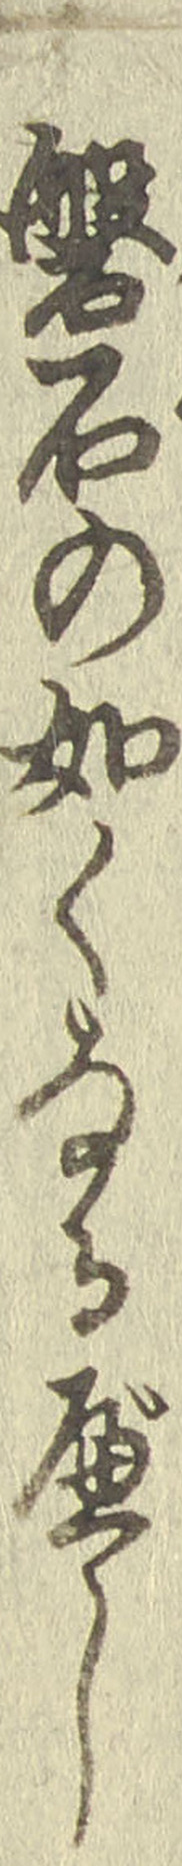盤石の如くなるべし
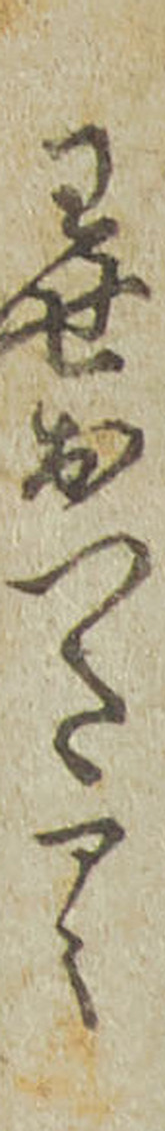わせおつたアヽ
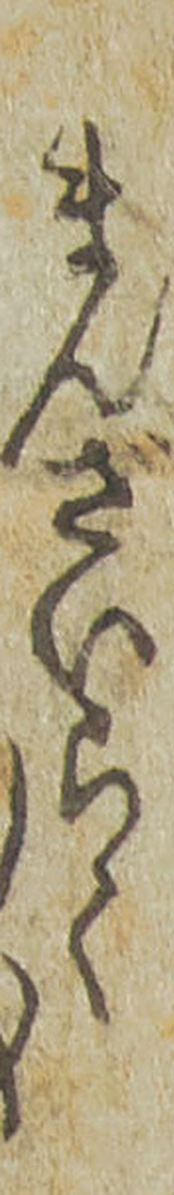まんざいらく
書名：上方震下り瓢磐鯰の化物 一名難獣といふ
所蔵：東京大学総合図書館 General Library in the University of Tokyo, JAPAN
